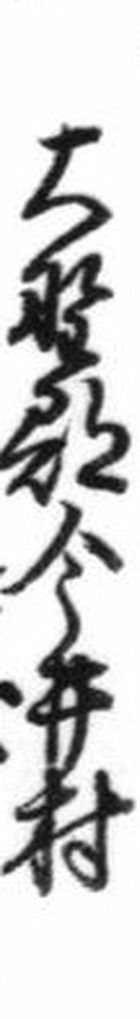大野郡今井村
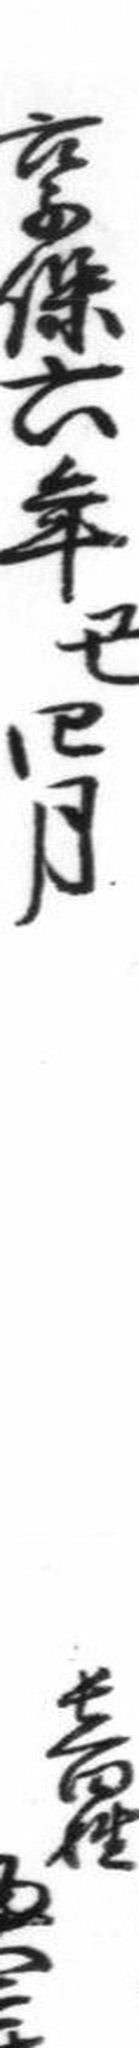享保六年丑四月長百姓
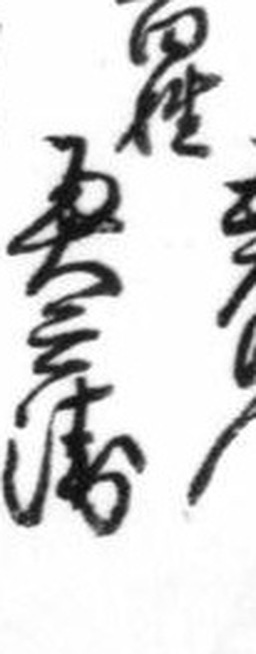奥兵衛
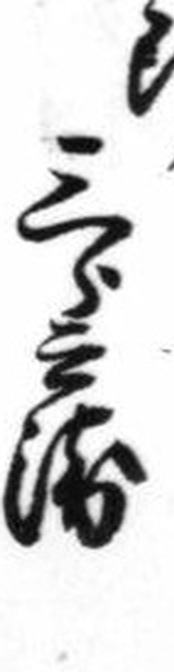三郎兵衛
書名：越前国大野郡今井村明細帳
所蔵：福井県文書館 Fukui Prefectural Archives
